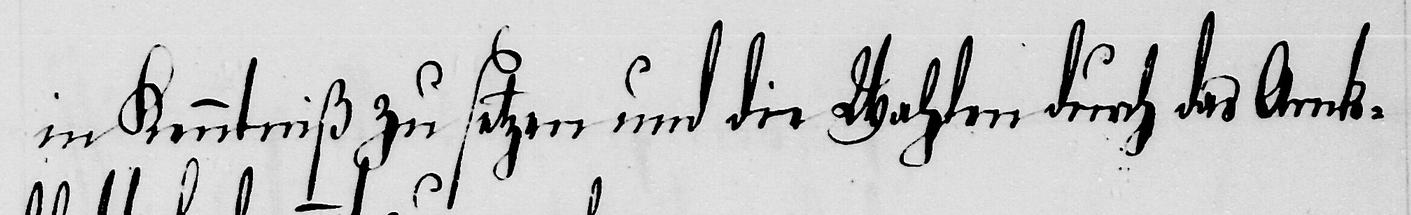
in Kenntniß zu setzen und die Wahlen durch das Amts¬
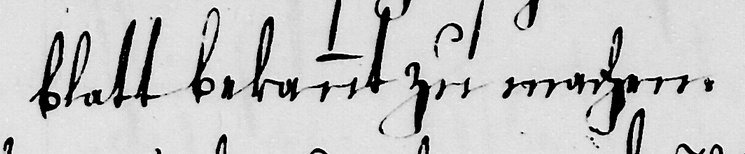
blatt bekannt zu machen.
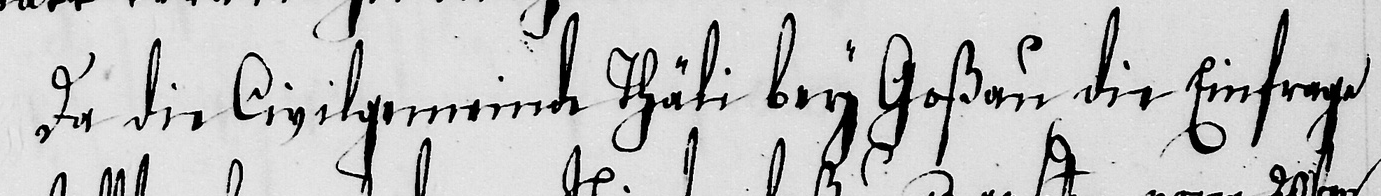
Da die Civilgemeinde Thäli bey Goßau die Einfrage
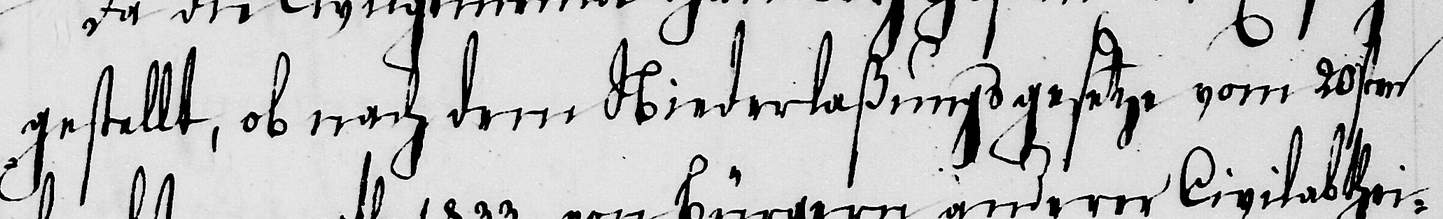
gestellt, ob nach dem Niederlaßungsgesetze vom 20sten
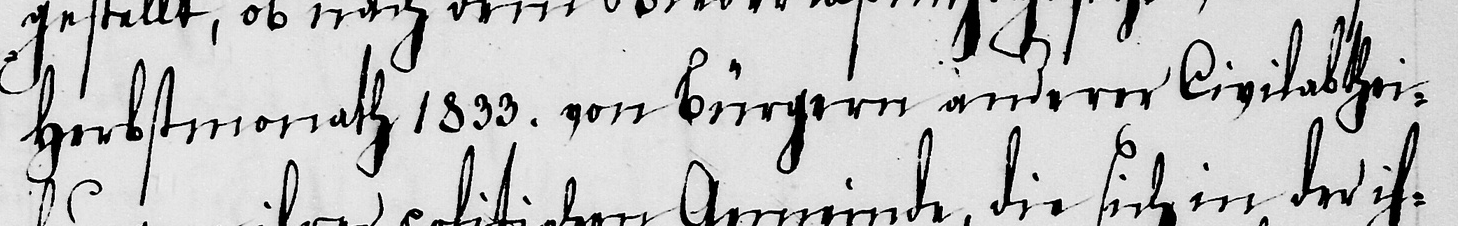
Herbstmonath 1833. von Bürgern anderer Civilabthei¬
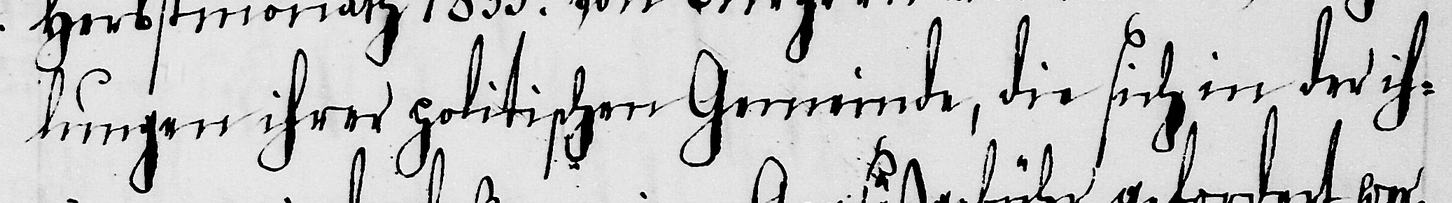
lungen ihrer politischen Gemeinde, die sich in der ih¬
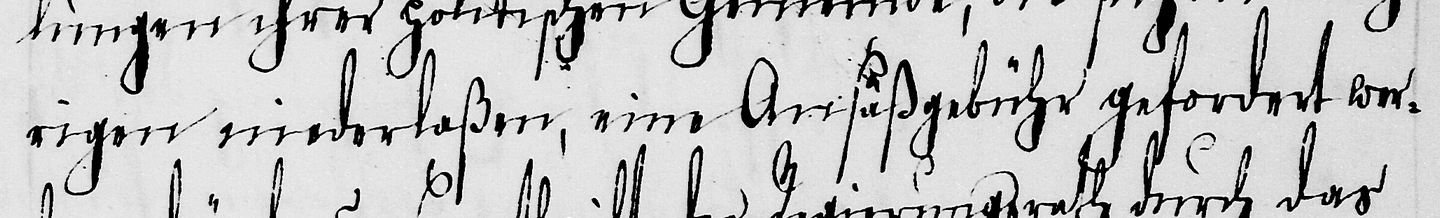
rigen niederlaßen, eine Ansäßengebühr gefordert wer¬
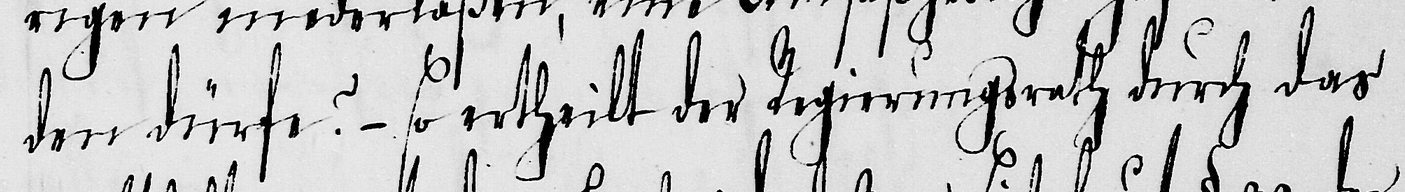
den dürfe? – so ertheilt der Regierungsrath durch das
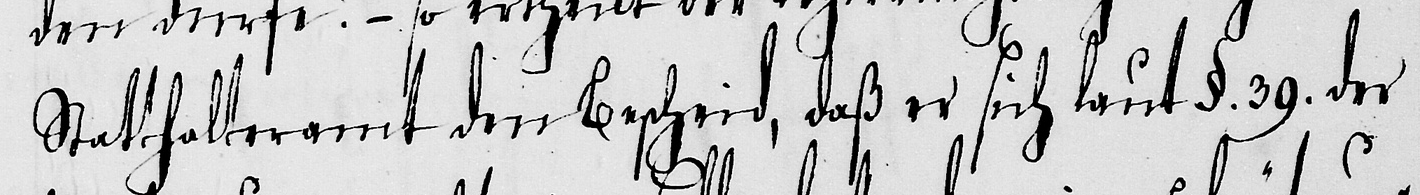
Statthalteramt den Bescheid, daß er sich laut §. 39. der
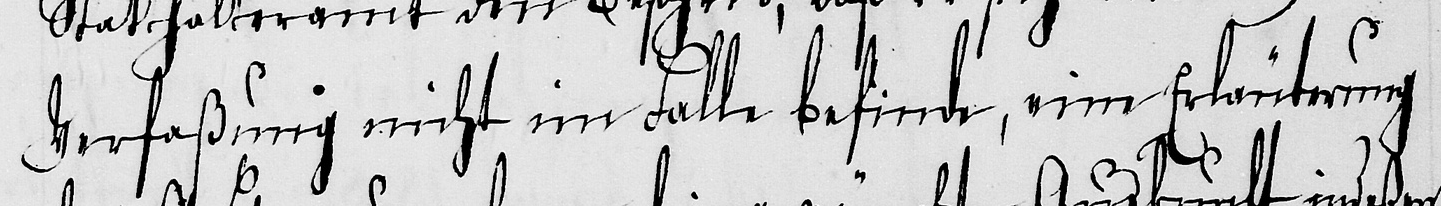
Verfaßung nicht im Falle befinde, eine Erläuterung
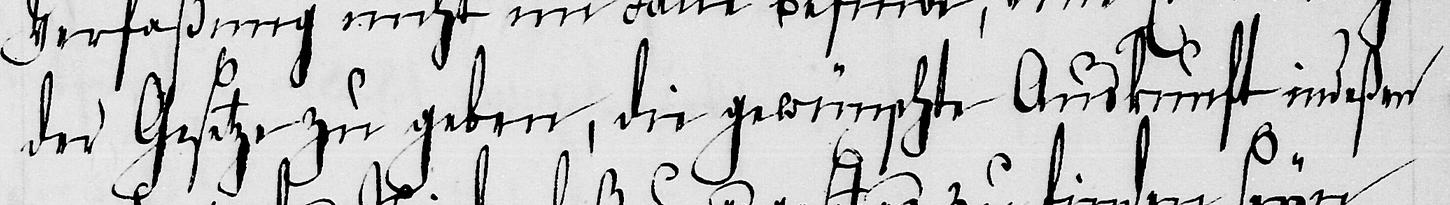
der Gesetze zu geben, die gewünschte Auskunft indeßen
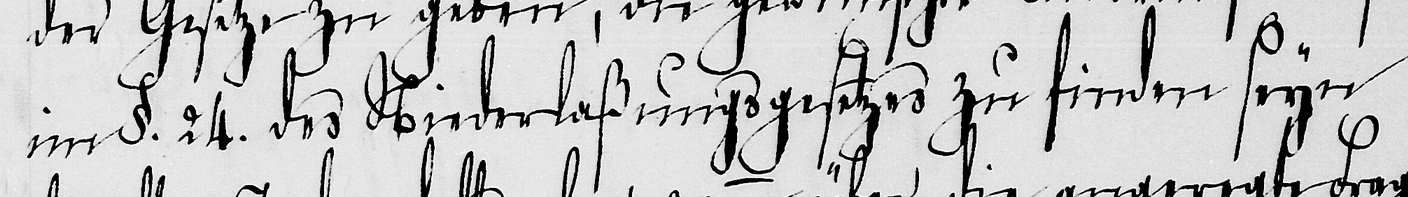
im §. 24. des Niederlaßungsgesetzes zu finden seyn
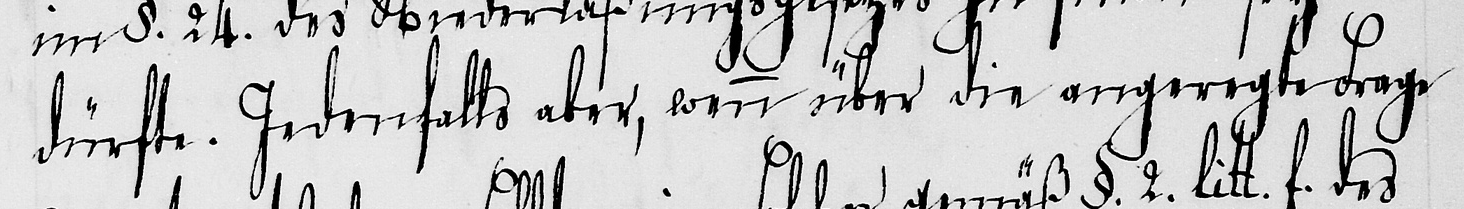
dürfte. Jedenfalls aber, wenn über die angeregte Frage
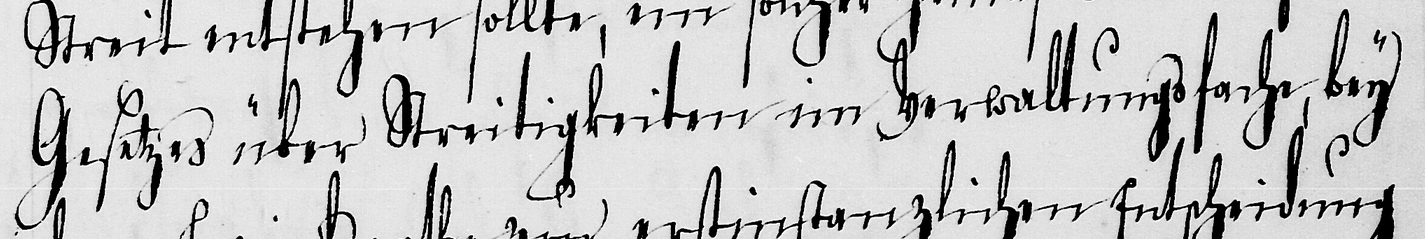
Gesetzes über Streitigkeiten im Verwaltungsfache, bey
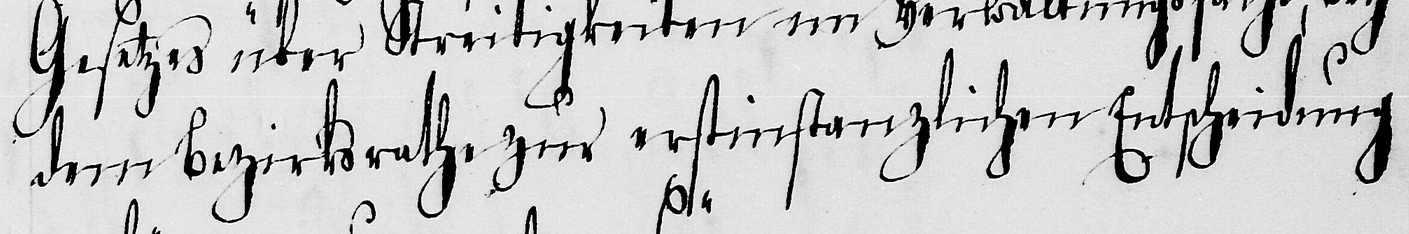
dem Bezirksrathe zur erstinstanzlichen Entscheidung
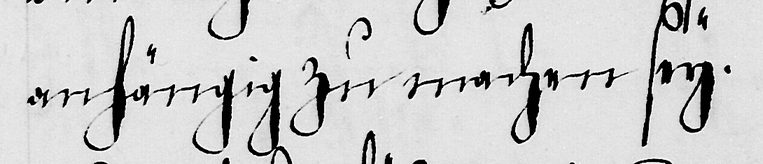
anhängig zu machen sey.
